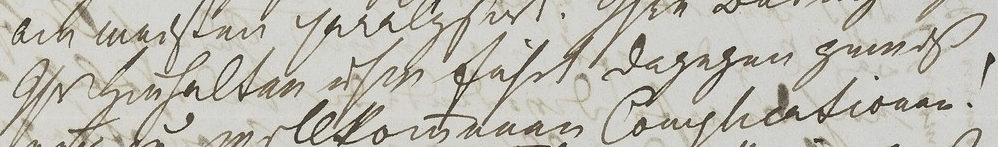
Ihr Hinhalten usw führt dagegen gewiß
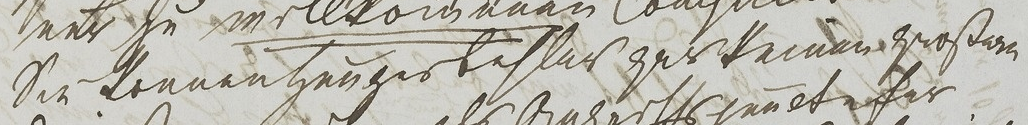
Sie können Hungerbühler gar keinen größern
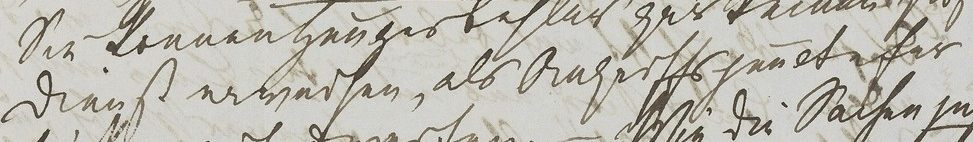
Dienst erweisen, als Angriffspuncte für
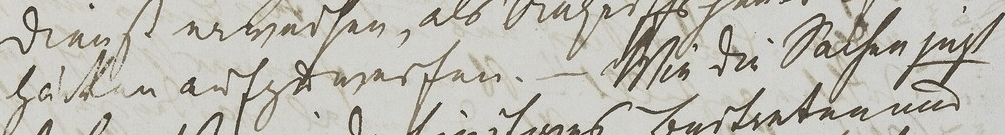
Häcken aufzuwerfen. – Wie die Sachen jezt
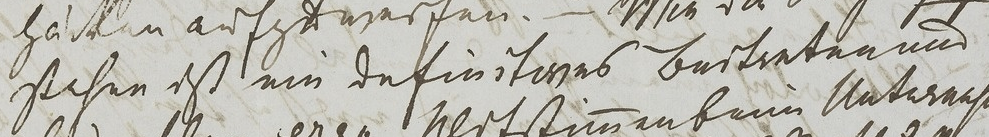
stehen ist ein definitives Beitreten und
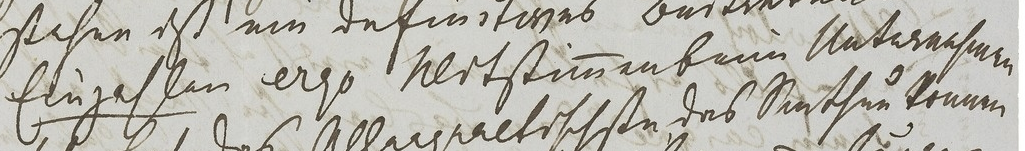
Einzahlen ergo Mitstimmen beim Unternehmen
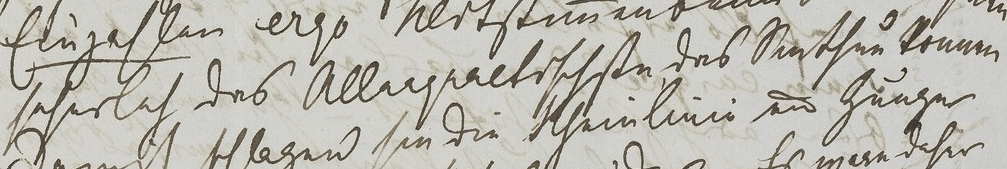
sicherlich das Allerpractischste das Sie thun können
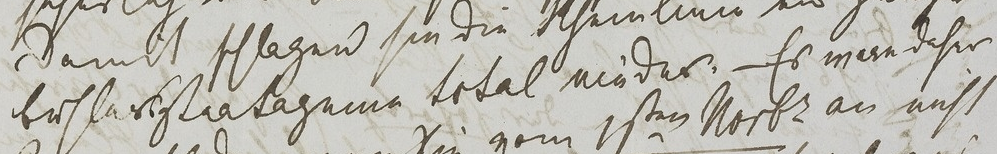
bühlers stratageme total nieder. – Es wäre daher
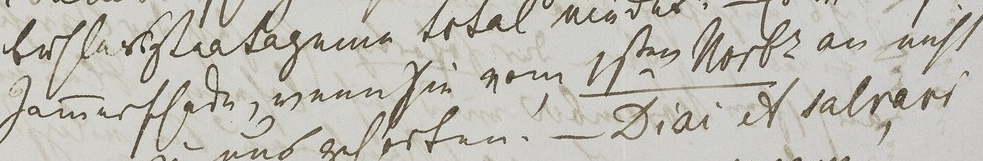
Jammerschade, wenn Sie vom 1sten Novbr an nicht
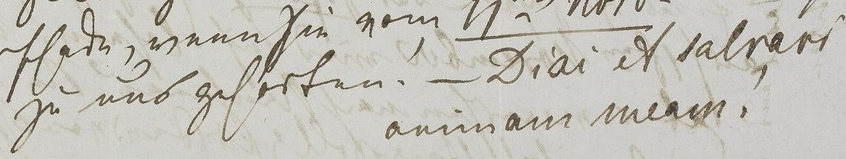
zu uns gehörten! – Dixi et salvavi
